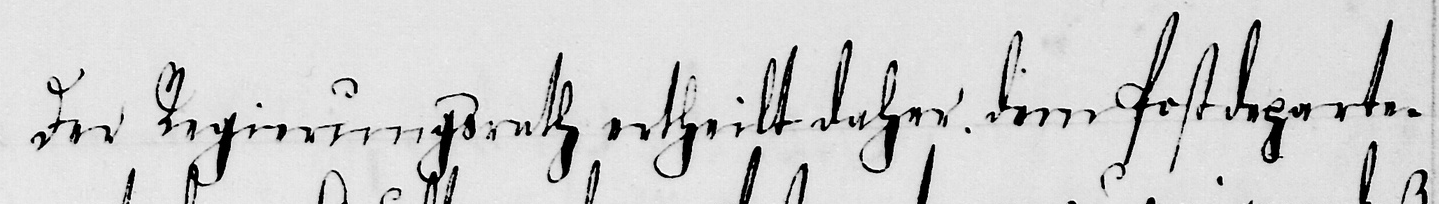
Der Regierungsrath ertheilt daher dem Postdeparte¬
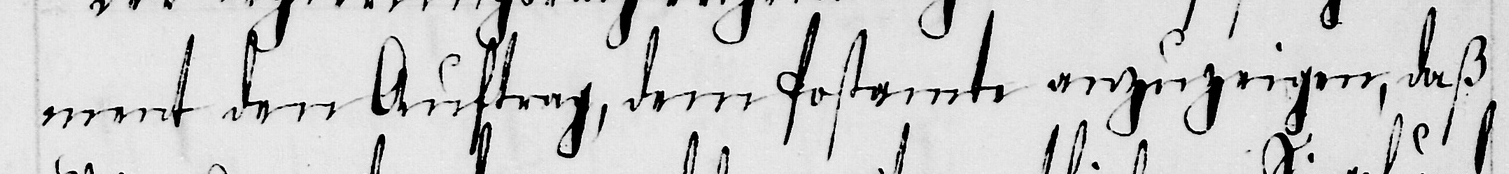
ment den Auftrag, dem Postamte anzuzeigen, daß
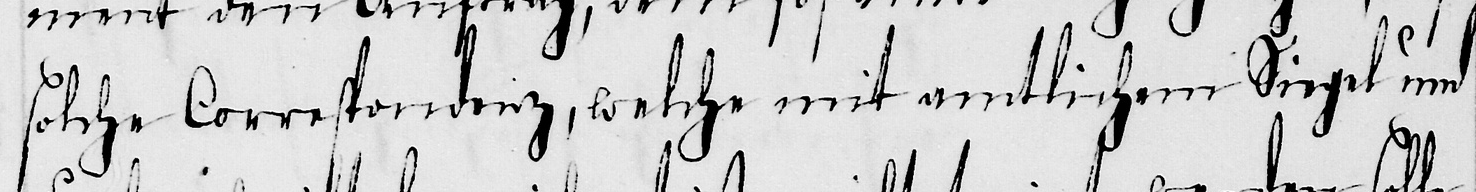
solche Correspondenz, welche mit amtlichem Siegel und
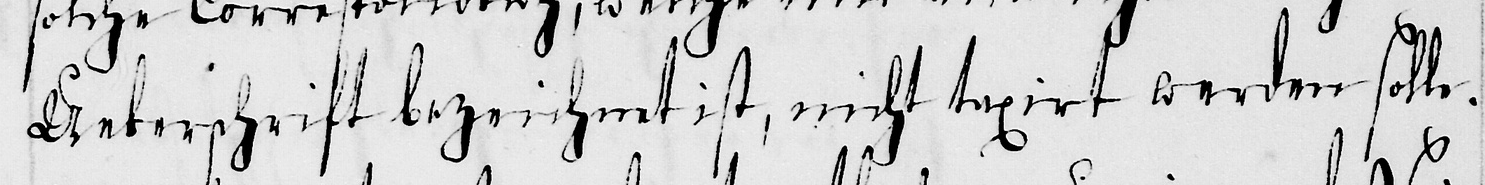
Unterschrift bezeichnet ist, nicht taxirt werden soll¬
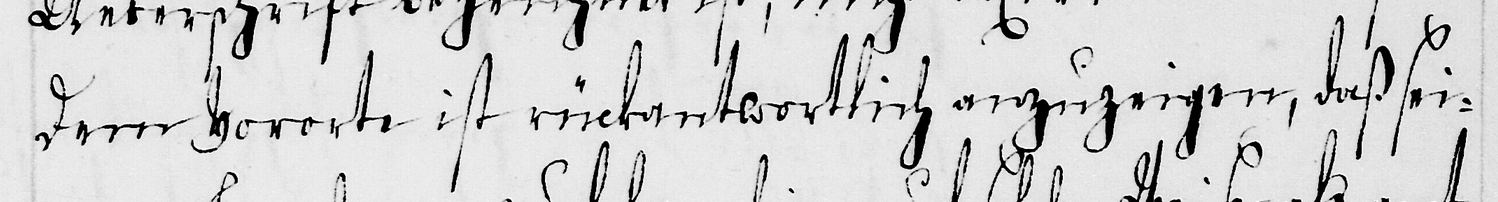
Dem Vororte ist rückantwortlich anzuzeigen, daß sei¬
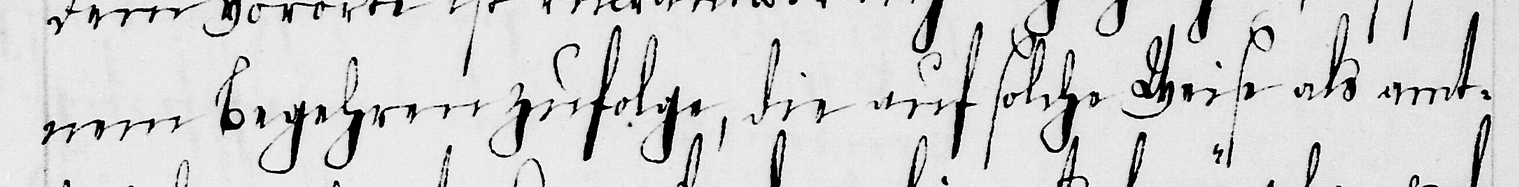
nem Begehren zufolge, die auf solche Weise als amt¬
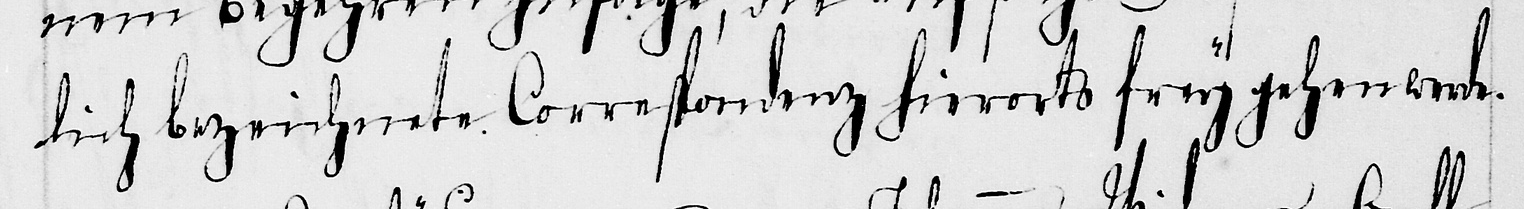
lich bezeichnete Correspondenz hierorts frey gehen werde.
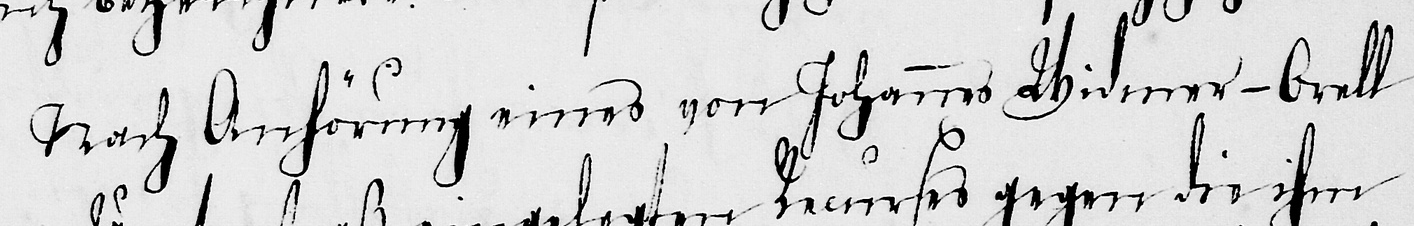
Nach Anhörung eines von Johannes Widmer-Orell
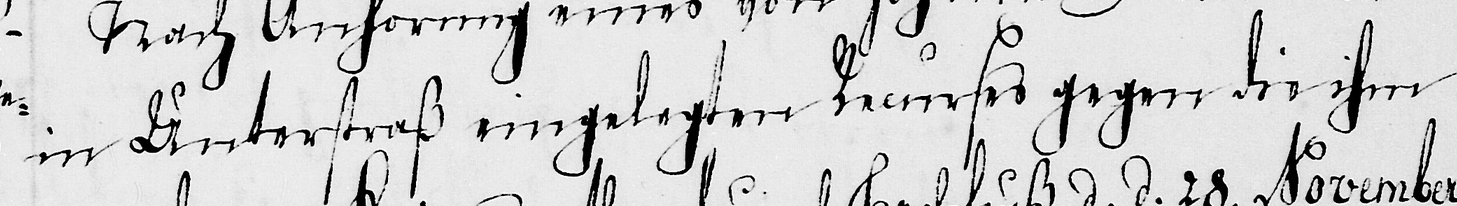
in Unterstraß eingelegten Recurses gegen die ihm
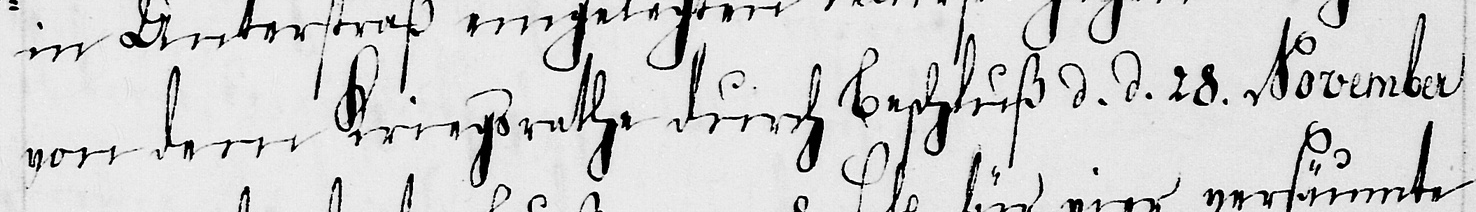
von dem Kriegsrathe durch Beschluß d. d. 28. November
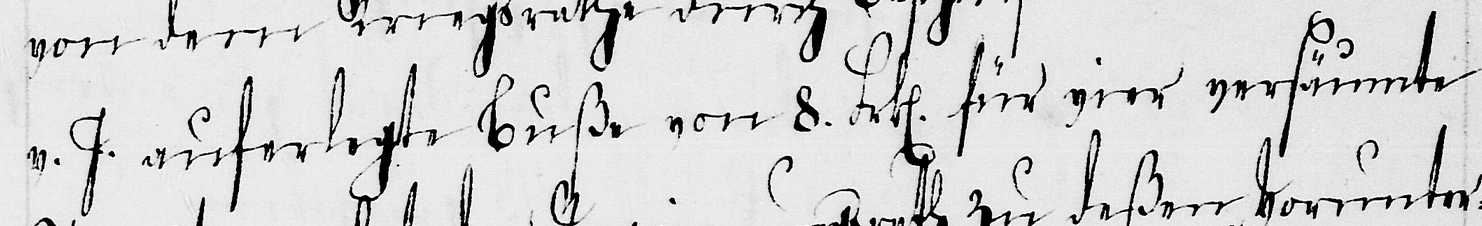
v. J. auferlegte Buße von 8. Frk. für vier versäumte
